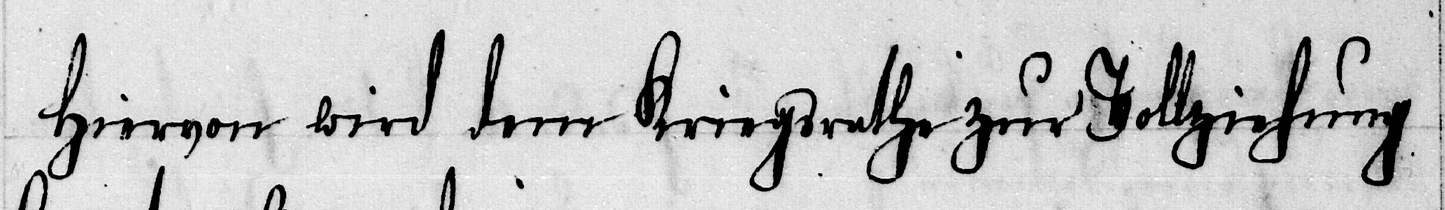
Hiervon wird dem Kriegsrathe zur Vollziehung
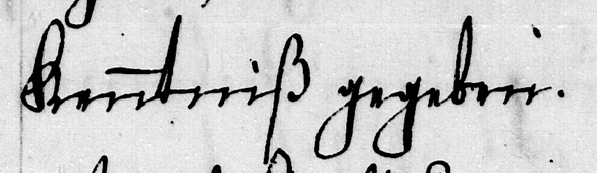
Kenntniß gegeben.
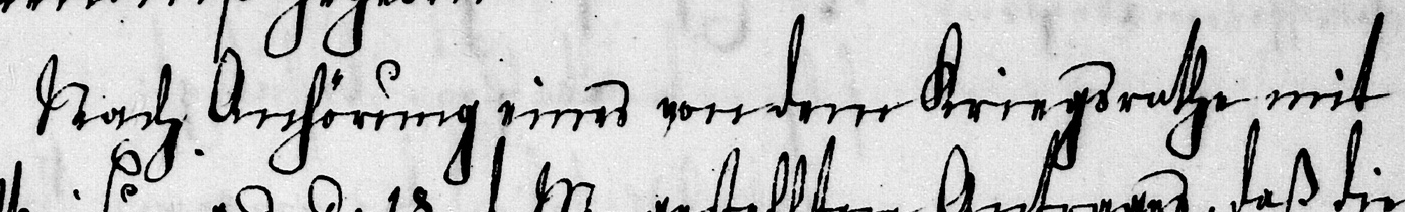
Nach Anhörung eines von dem Kriegsrathe mit
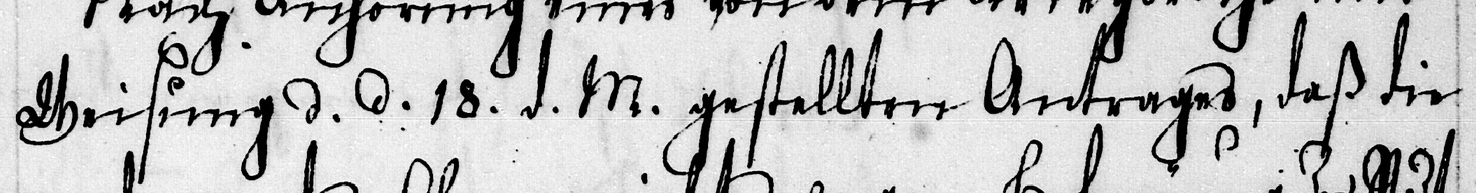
Weisung d. d. 18. d. M. gestellten Antrages, daß die
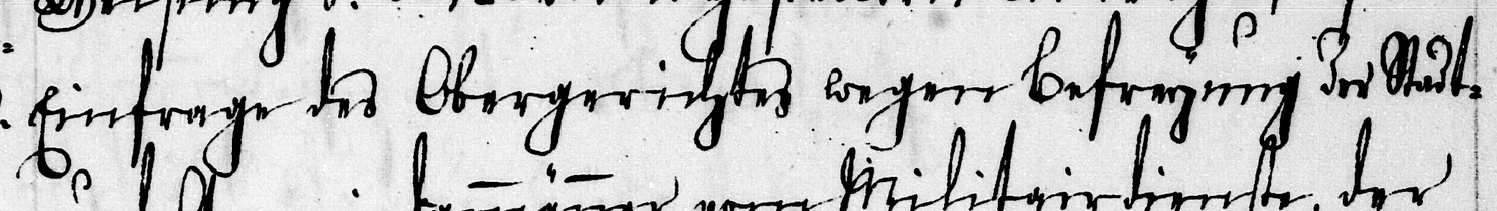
Einfrage des Obergerichtes wegen Befreyung der Stadt-
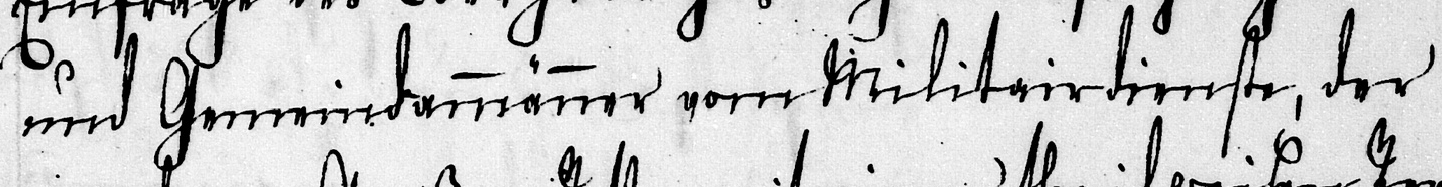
und Gemeindammänner vom Militairdienste, der
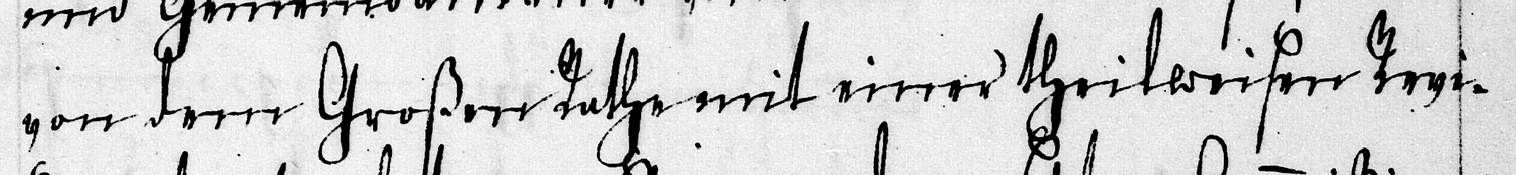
von dem Großen Rathe mit einer theilweisen Revi¬
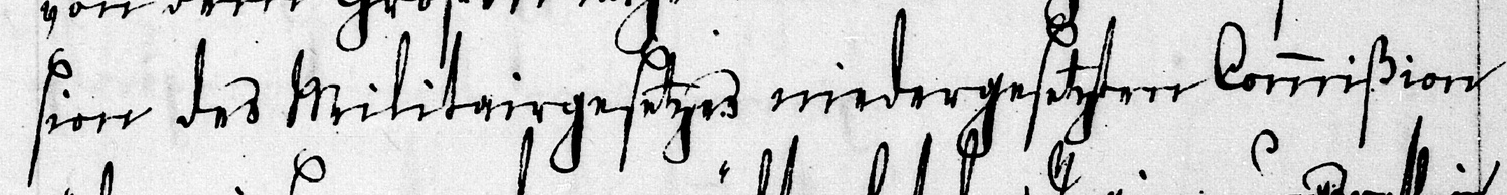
sion des Militairgesetzes niedergesetzten Commißion
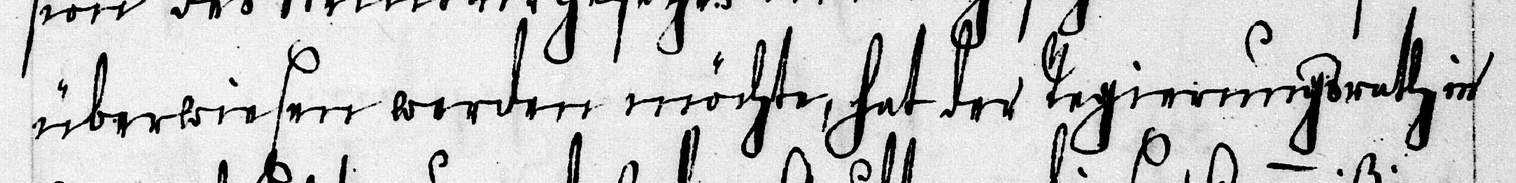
überwiesen werden möchte, hat der Regierungsrath in
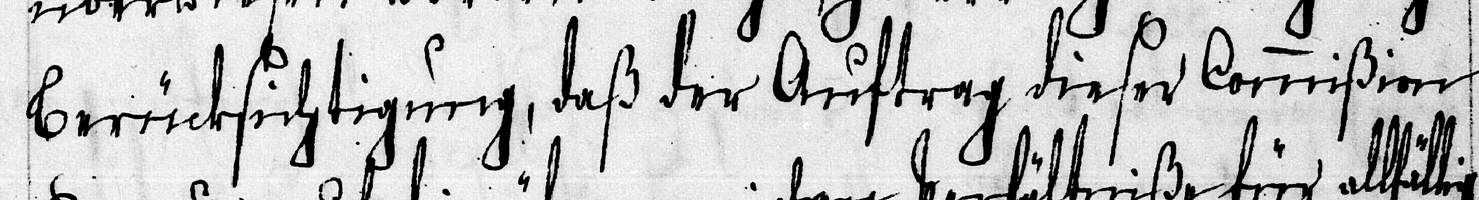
Berücksichtigung, daß der Auftrag dieser Commißion
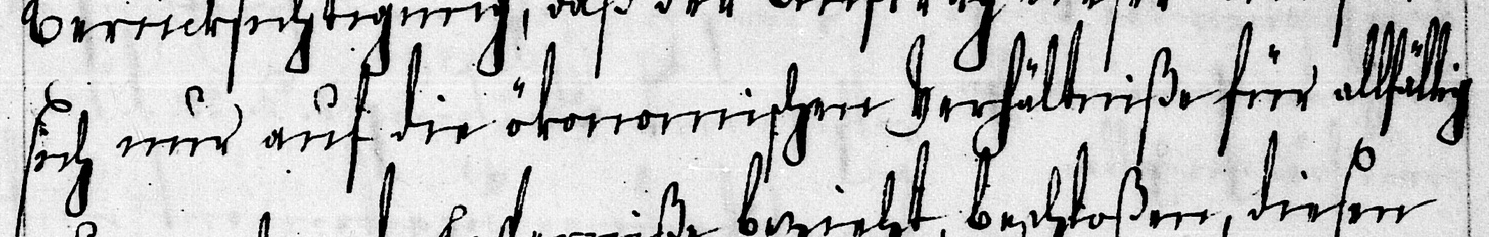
sich nur auf die ökonomischen Verhältniße für all¬
